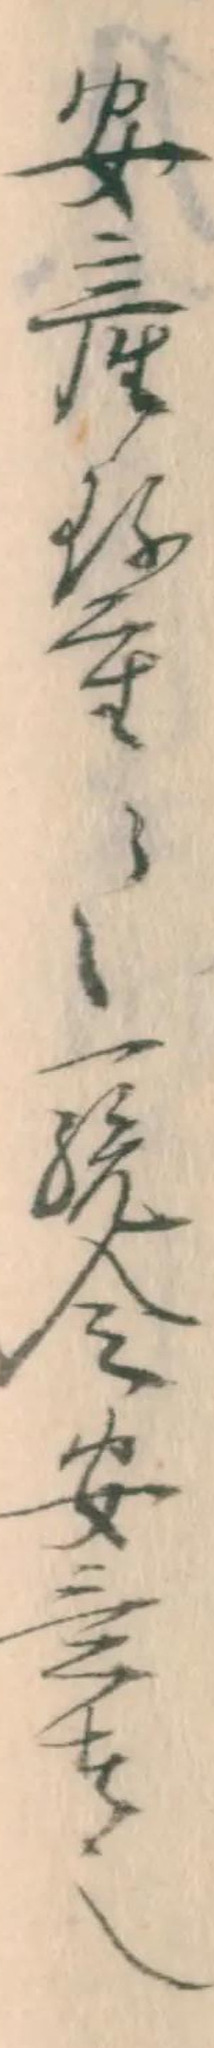安産珍重々々一統令安意者也
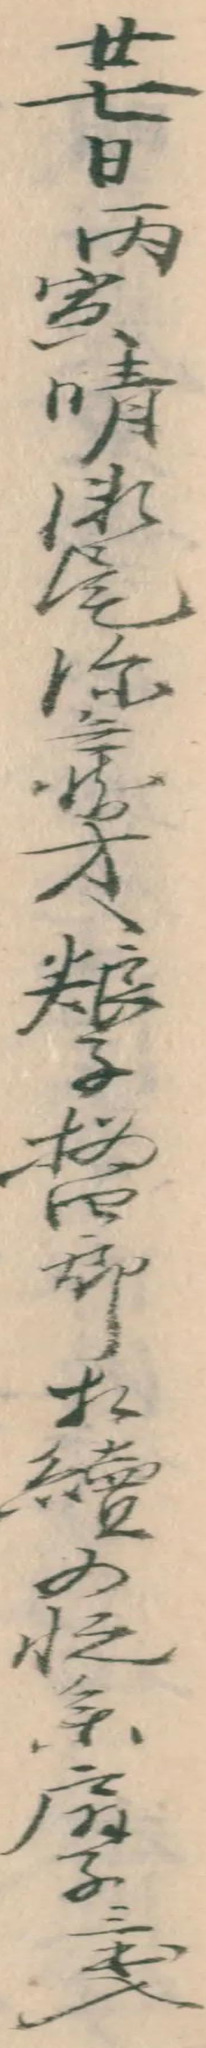廿七日丙寅晴瀬尾弥兵衛方へ養子梅四郎相續為祝参扇子三本入
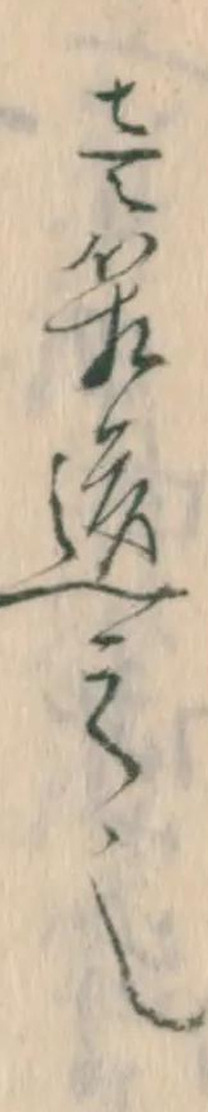壱箱送之也
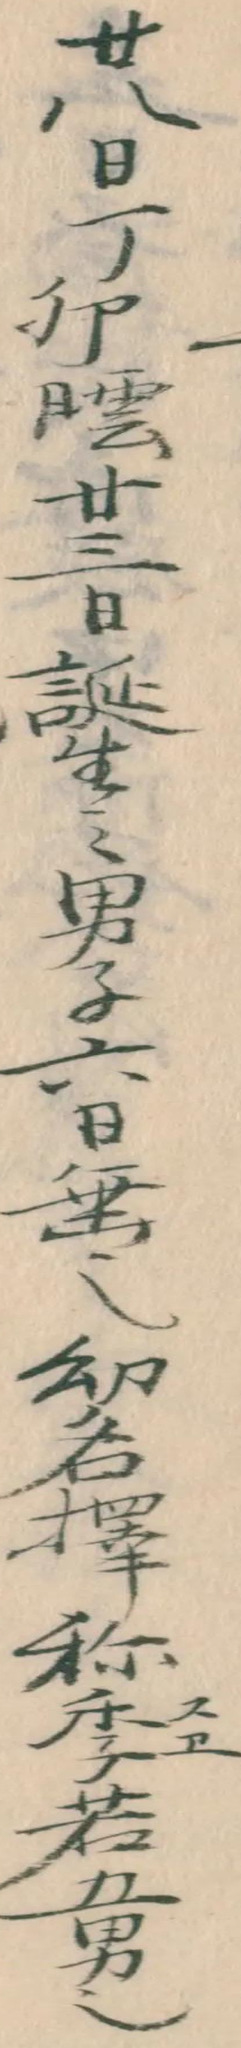廿八日丁卯晴廿三日誕生之男子六日垂也幼名擇称季若五男也
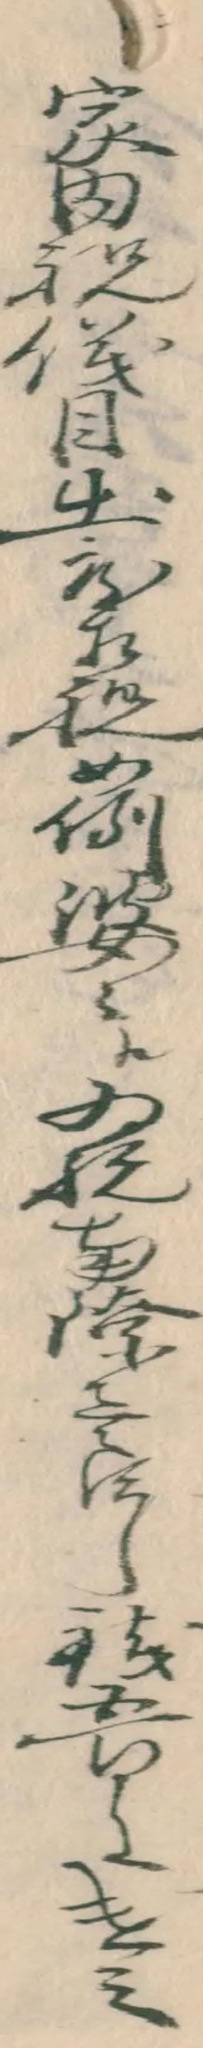家内祝儀目出度相祝如例婆々え為祝南鐐壱銭五百文遣之
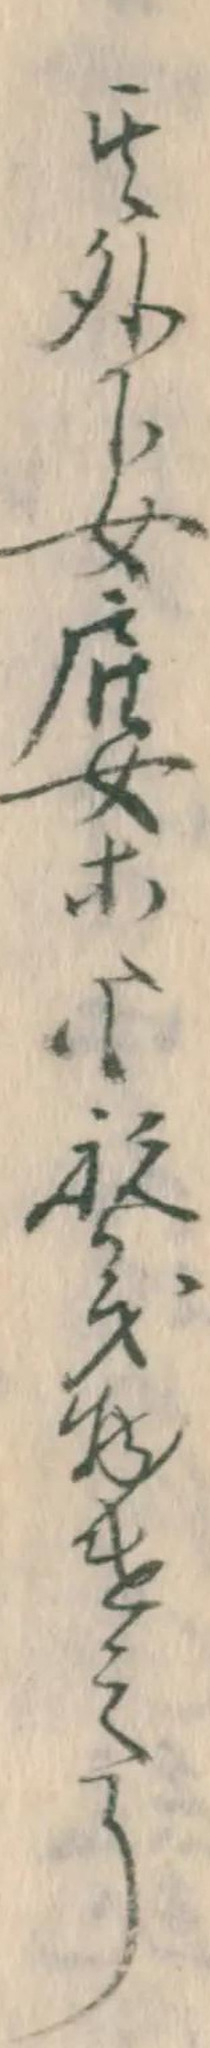其外下女雇女等へも祝義物遣之了
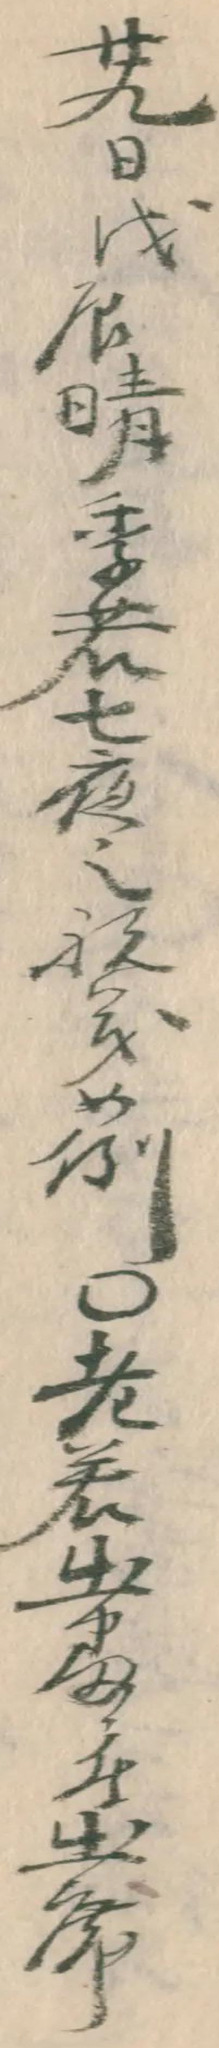廿九日戊辰晴季若七夜之祝義如例〇老若出番ニ付出席
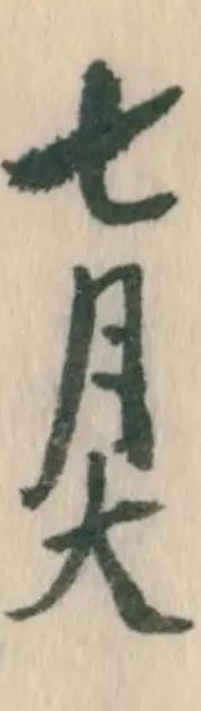七月大
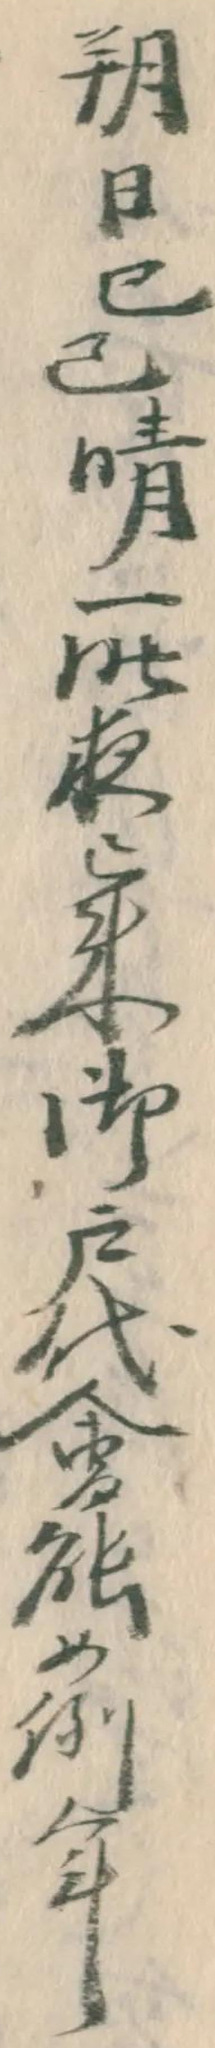朔日己巳晴一昨夜已来御戸代會能如例年
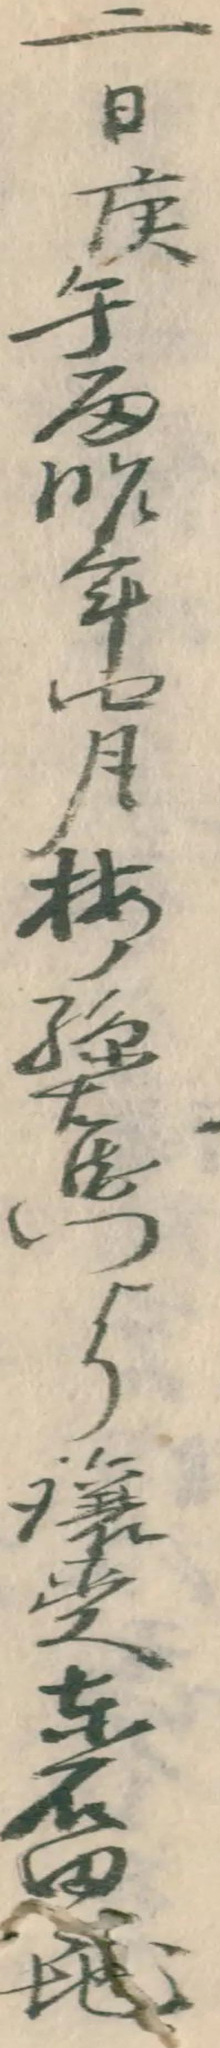二日庚午雨昨年四月梅ノ孫右衛門より譲受東石田地
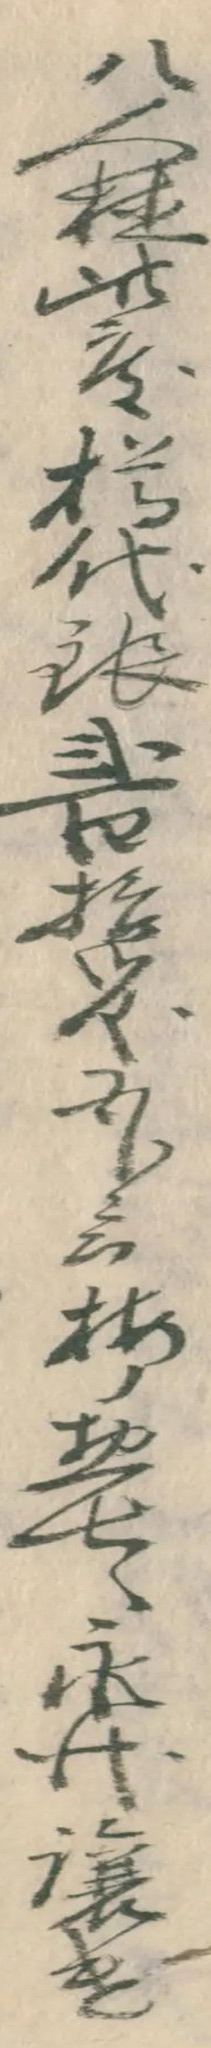八人植此度樽代銀弐百拾弐匁五分ニ而梅ノ惣七へ永代譲遣
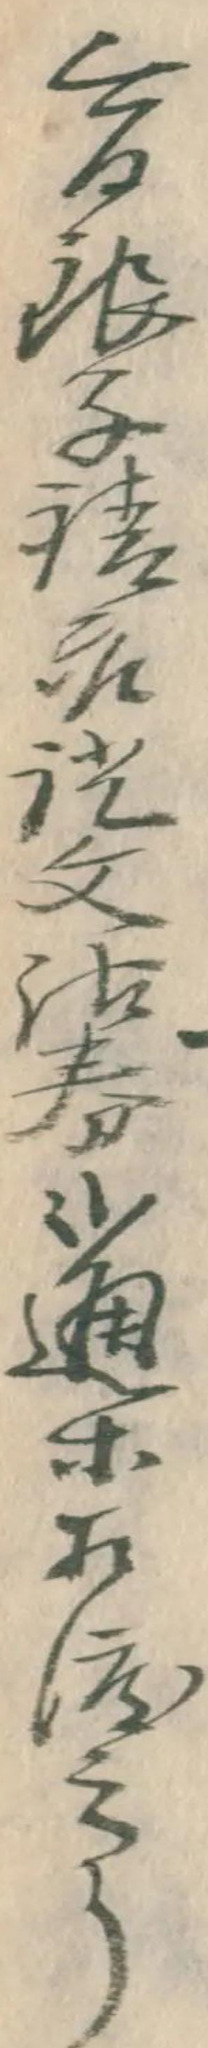今日銀子請取證文沽券弐通等相渡之事

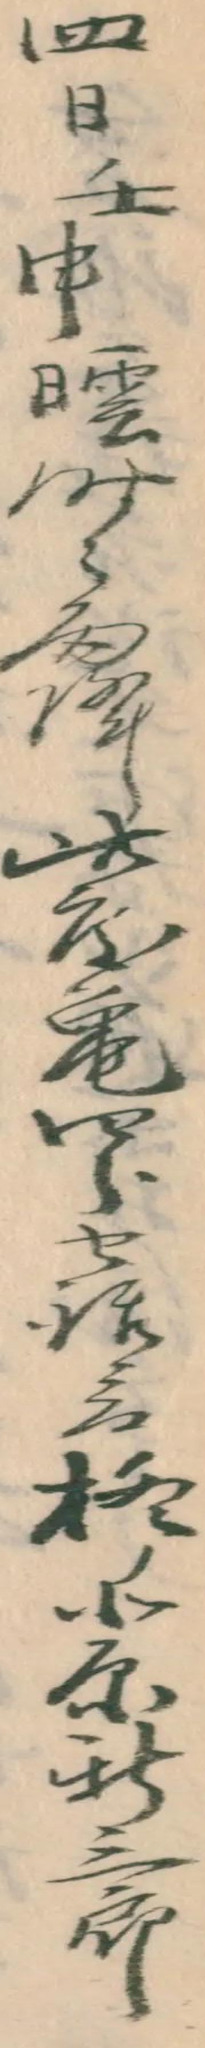四日壬申曇時々雨降此度亀四郎世話ニ而柊ノ北原新三郎
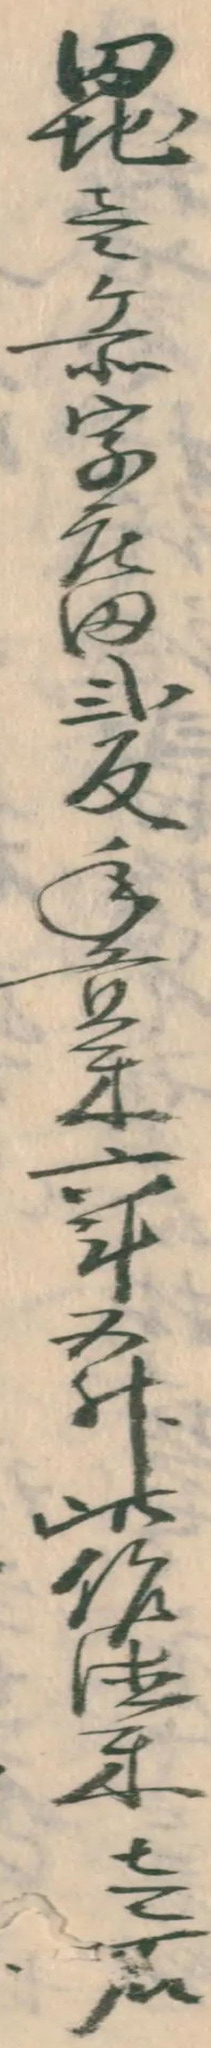田地壱ケ所字庄田弐反年貢米六斗五升此作徳米壱石
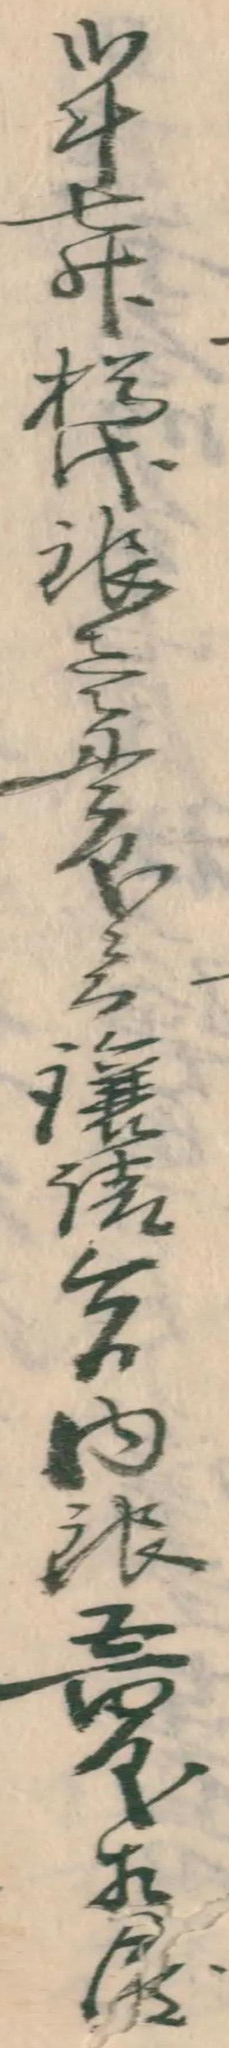弐斗七升樽代銀壱匁ニ朱ニ而譲請今日内銀五百匁相渡
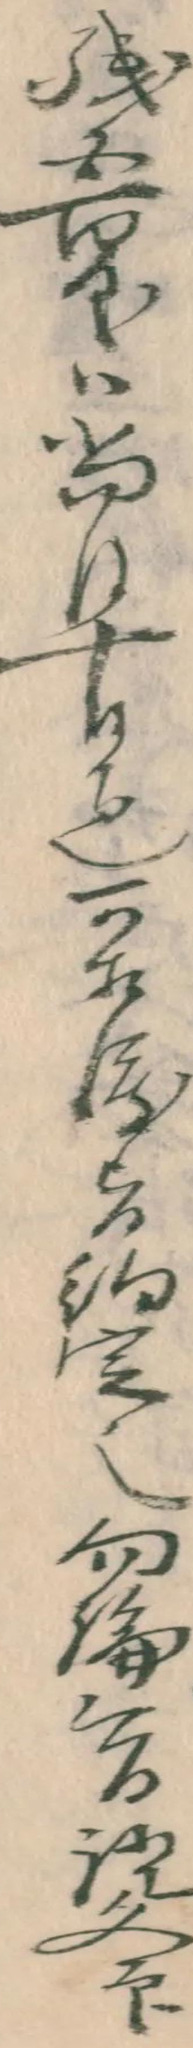残五百疋ハ當月十日迄可相渡旨約定之勿論今日證文印
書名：賀茂社記録. 第66冊
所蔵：国立国会図書館 National Diet Library, JAPAN
